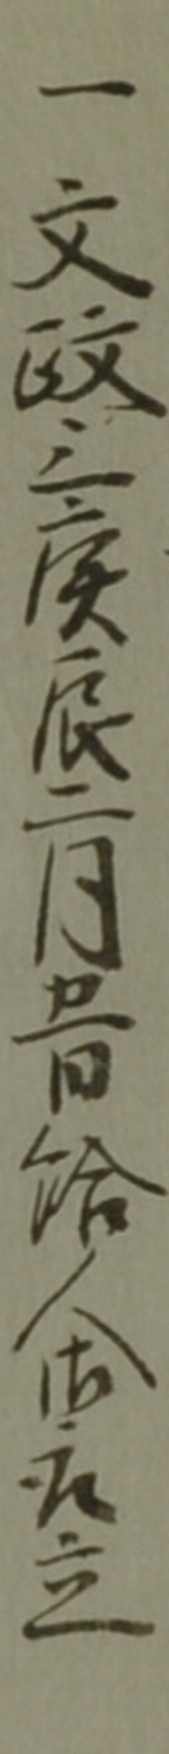一文政三庚辰二月五日給人御取立
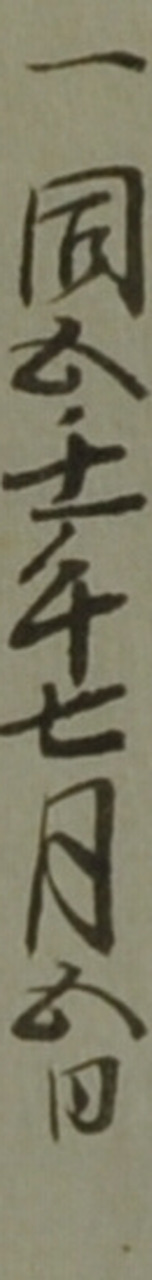一同五壬午七月五日
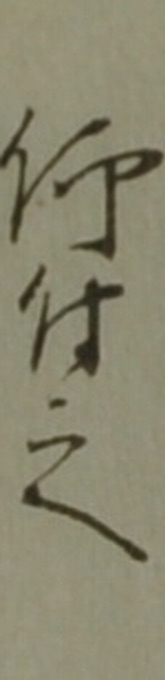仰付之
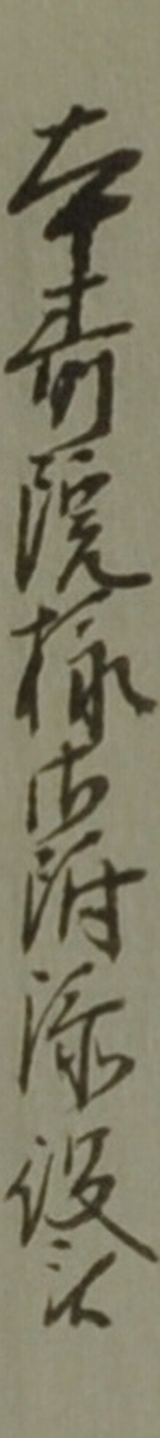本寿院様御附添役被
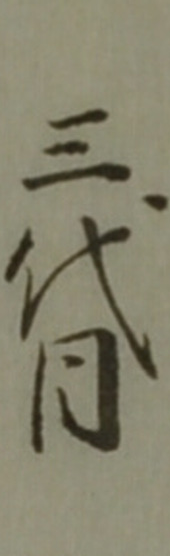三代目
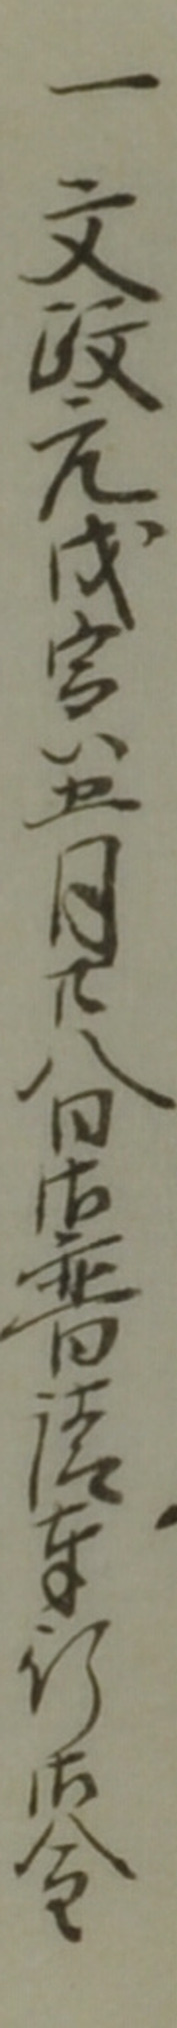一文政元戊寅五月廿八日御普請奉行御
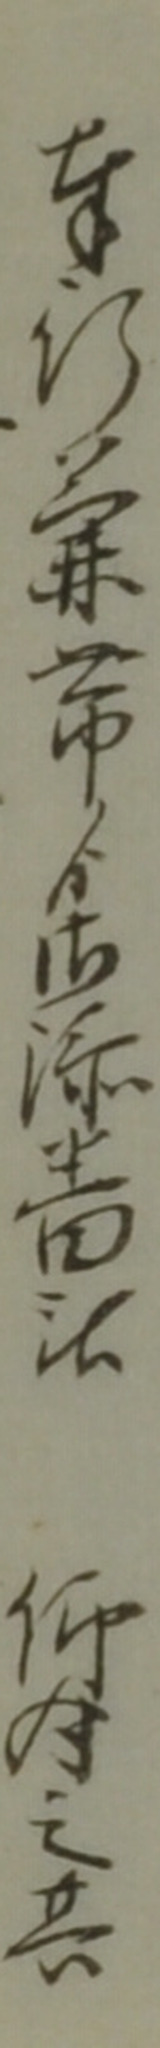奉行兼帯より御添番被仰付之其
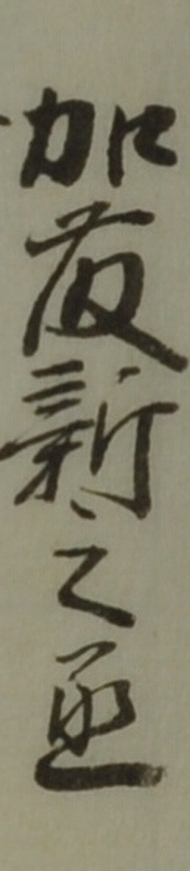加藤新之丞
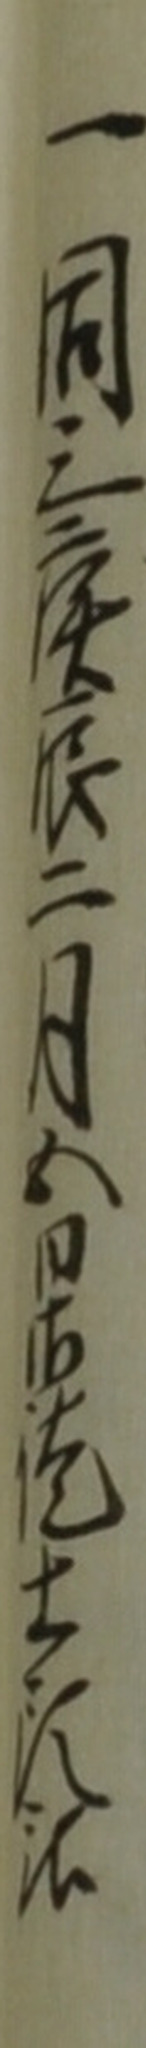一同三庚辰二月五日御徒士頭被
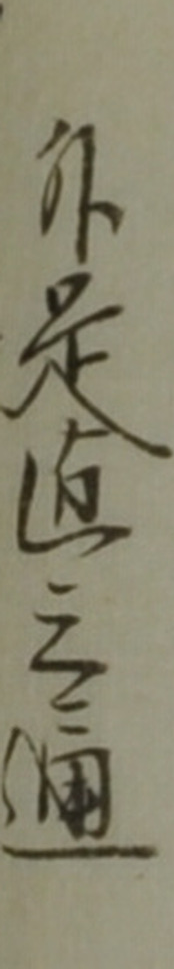外是迄之通
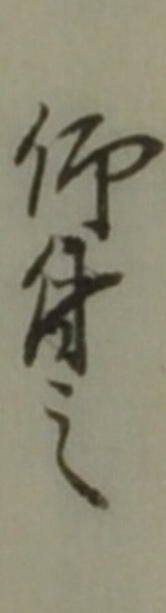仰付之
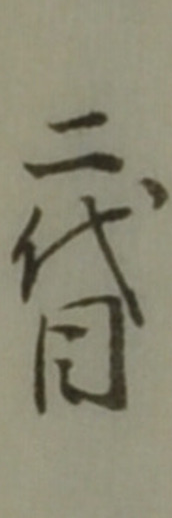二代目
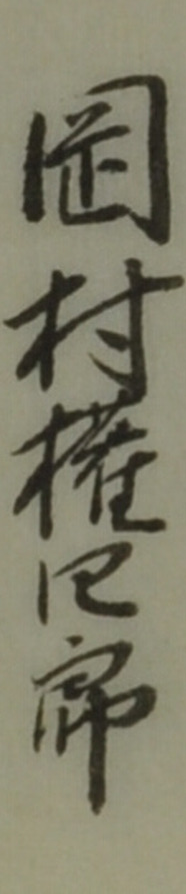岡村権四郎
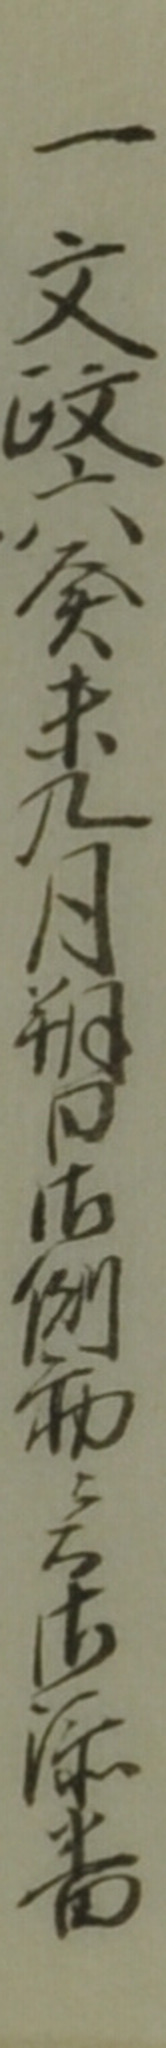一文政六癸未九月朔日御側勤に而御添番
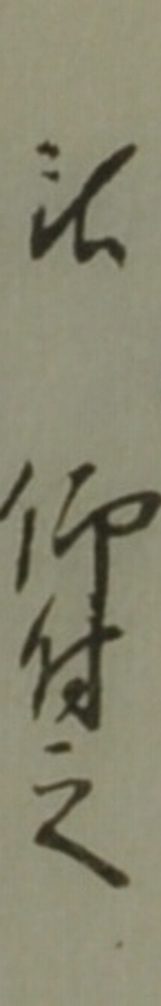被仰付之
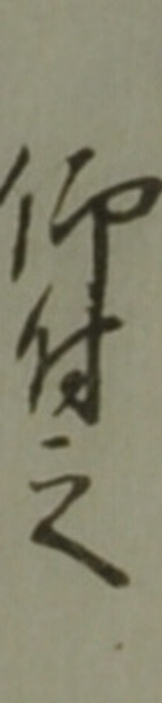仰付之
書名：諸御役代々録（八）
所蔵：伊那市立高遠町図書館・合同会社AMANE
